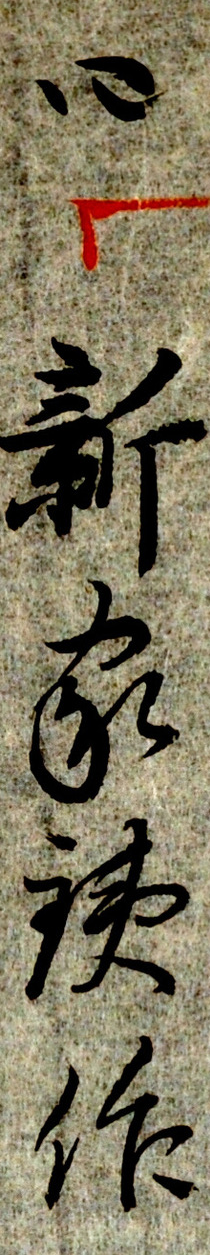四新家鉄作
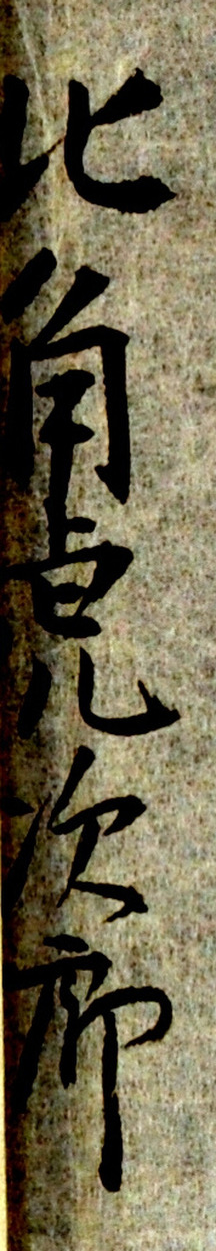北角虎次郎

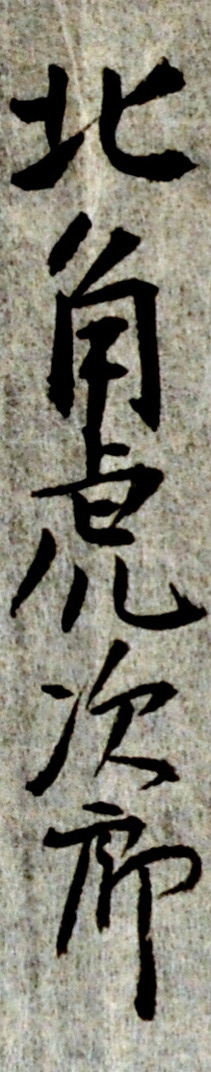北角虎次郎
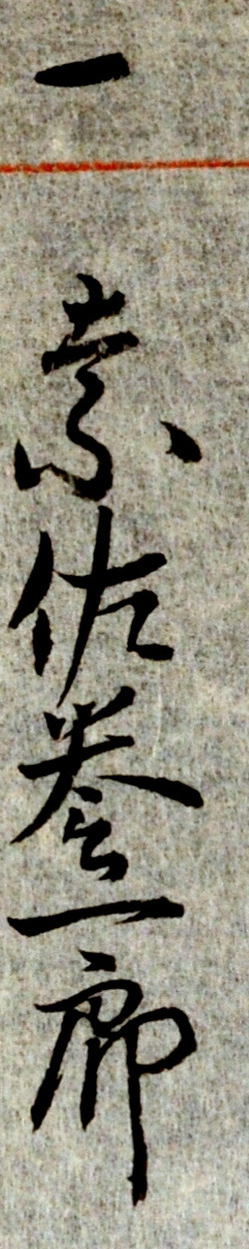一奈佐巻一郎
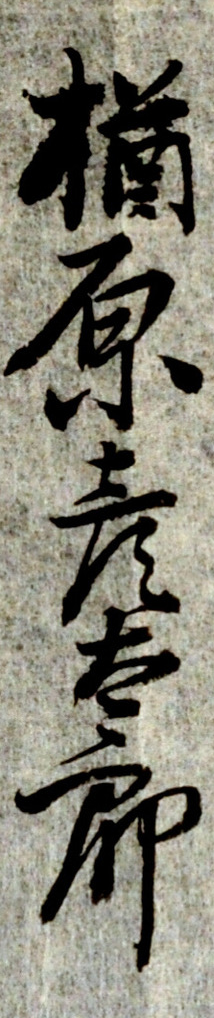楢原彦太郎
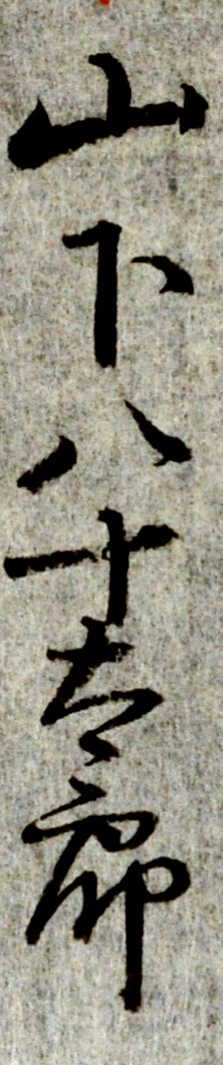山下八十太郎
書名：若年寄御役中御調書付
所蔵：伊那市立高遠町図書館・合同会社AMANE
